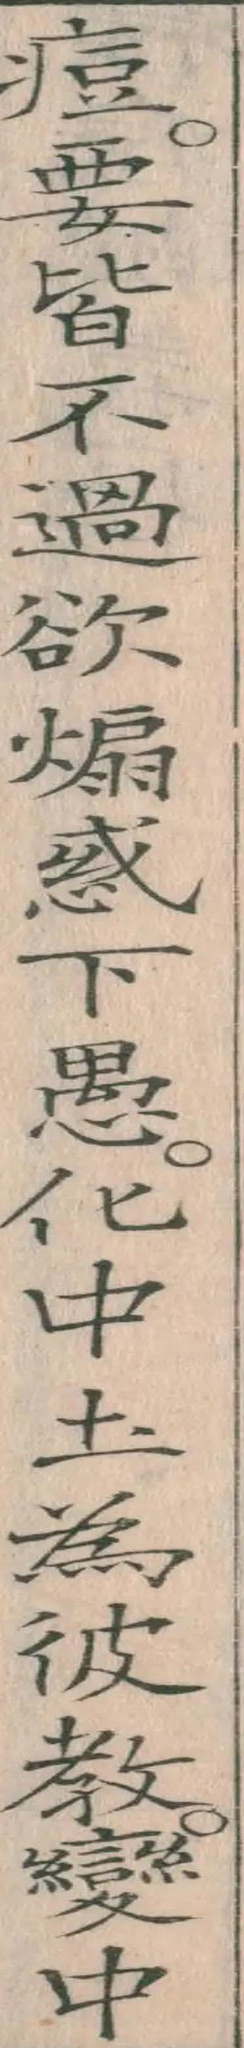痘。要皆不過欲煽惑下愚。化中土為彼教。変中
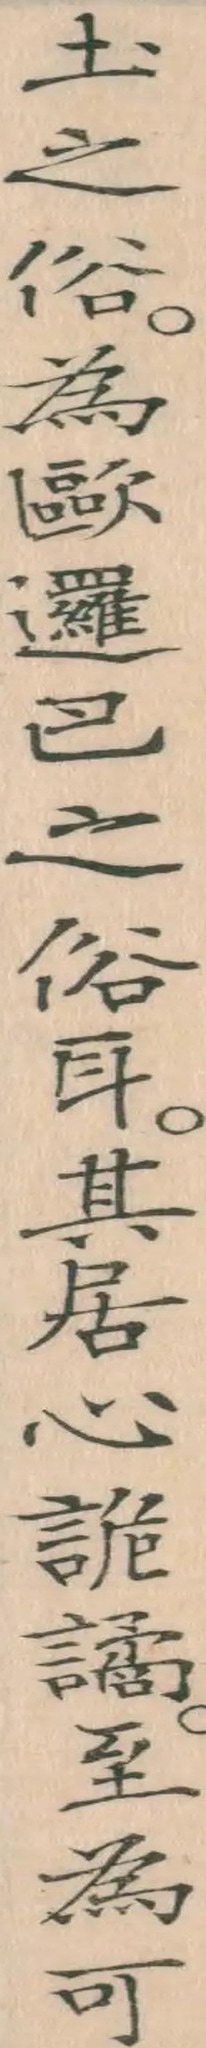土之俗。為欧邏巴之俗耳。其居心詭譎。至為可
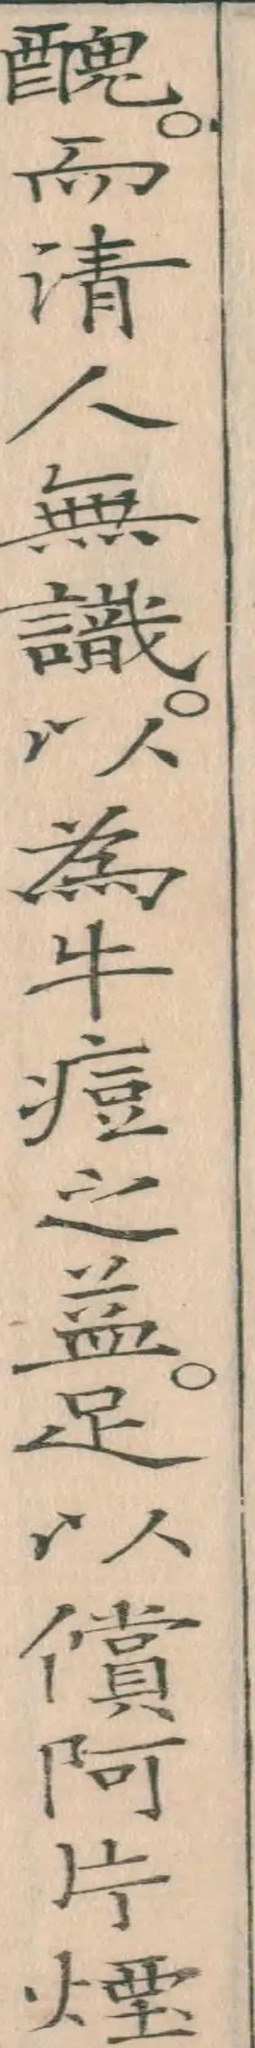醜。而清人無識。以為牛痘之益。足以償阿片煙
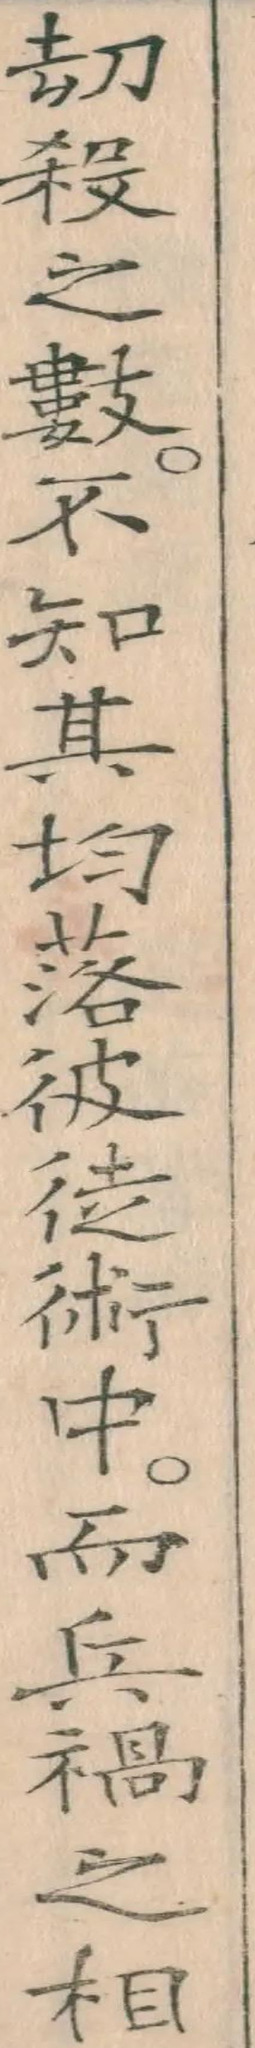劫殺之数。不知其均落彼徒術中。而兵禍之相
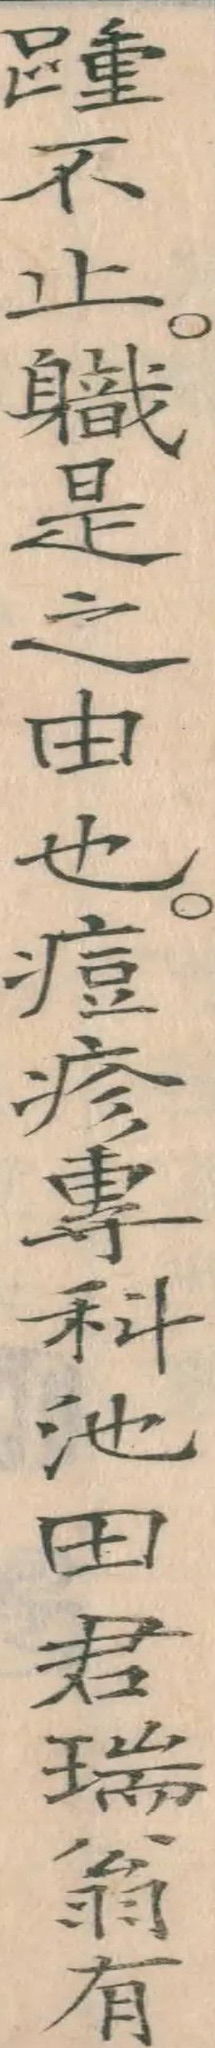踵不止。職是之由也。痘疹専科池田君瑞翁有
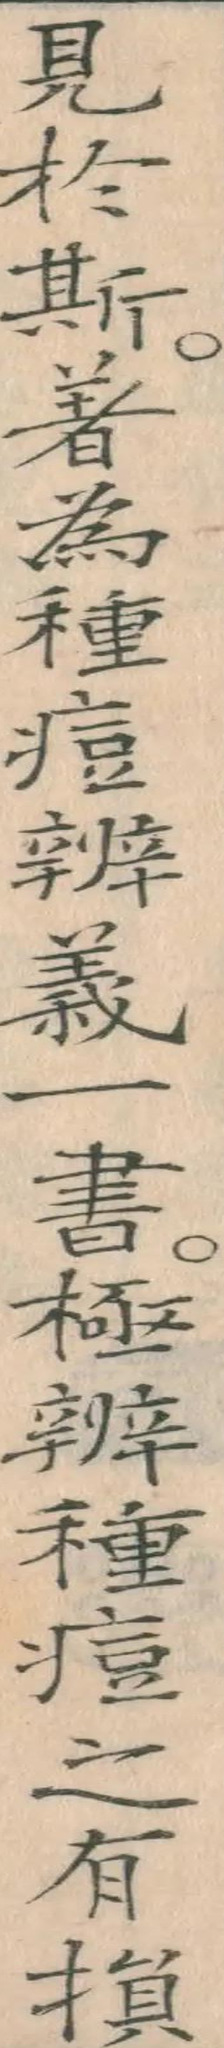見於斯。着為種痘弁義一書。極弁種痘之有損
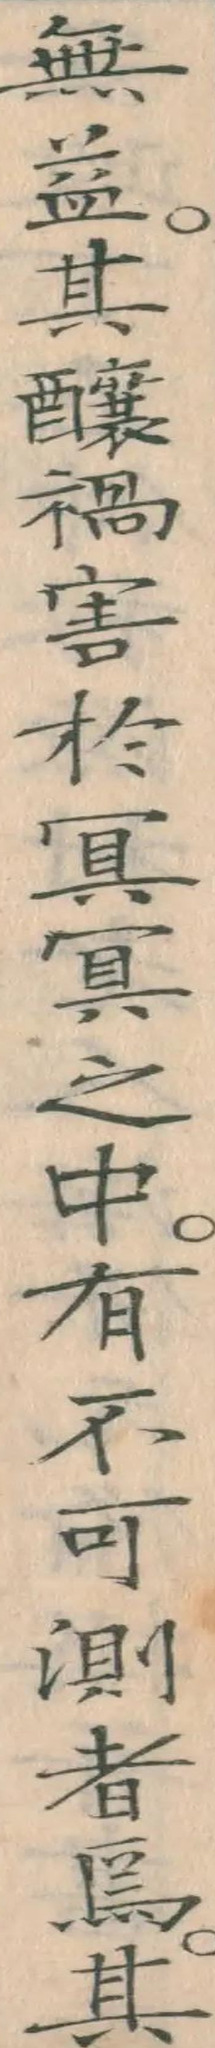無益。其醸禍害於冥冥之中。有不可測者焉。其
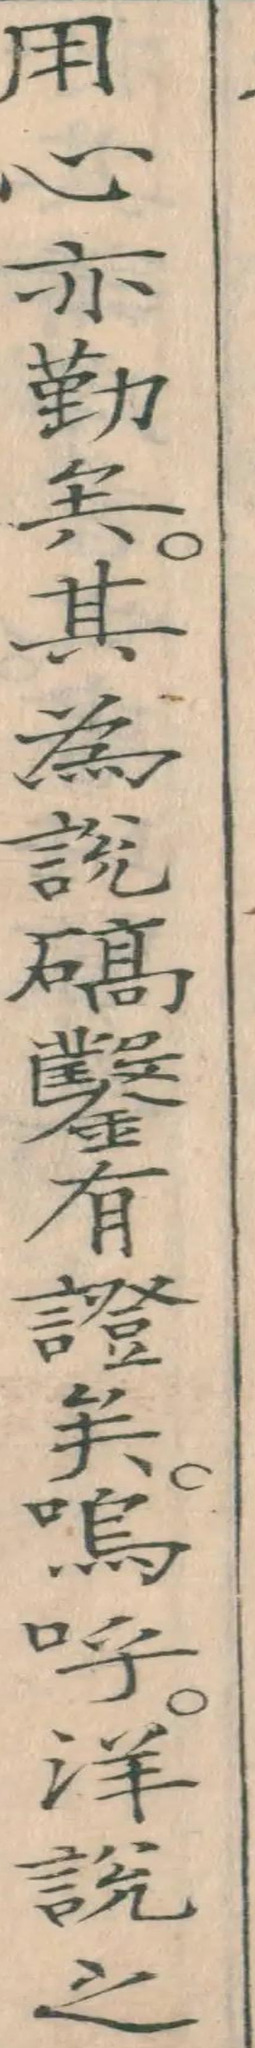用心亦勤▢。其為説碻有証矣。嗚呼。洋説之
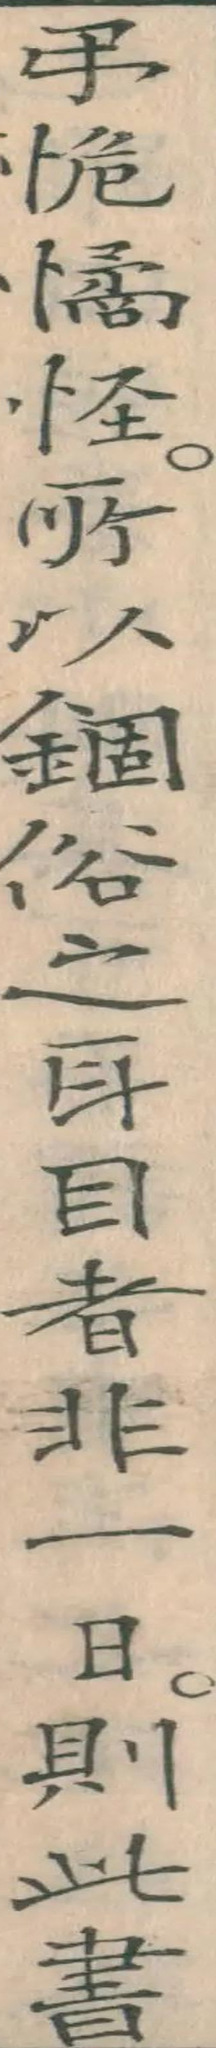弔恑憰怪。所以錮俗之耳目者非一日。則此書

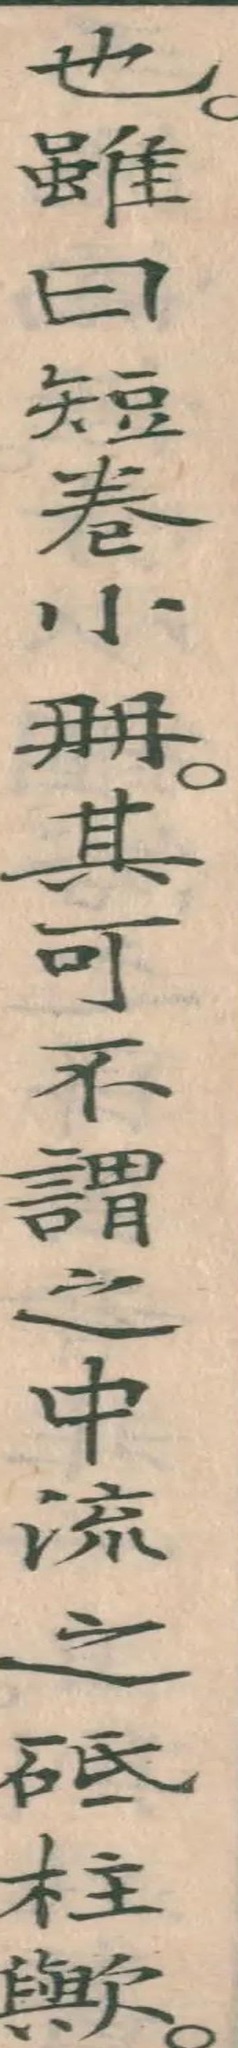也。雖日短巻小冊。其可不謂之中流之砥柱歟。
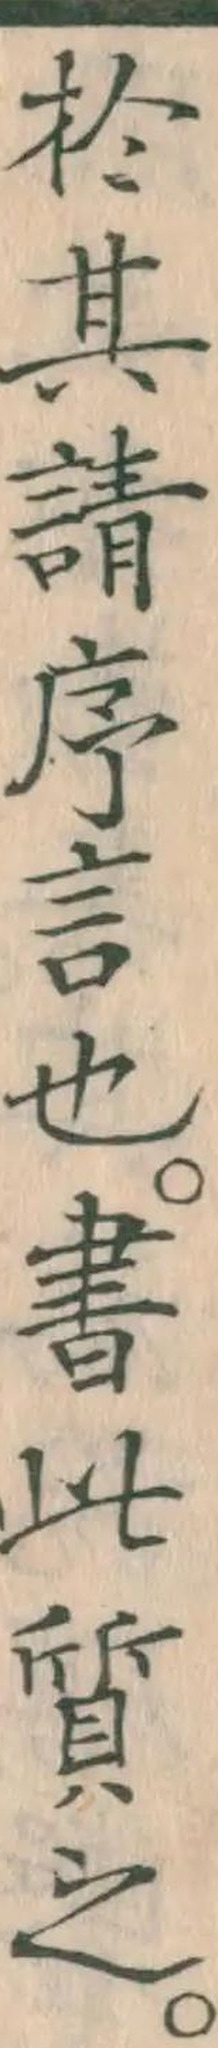於其請序言也。書此質之。
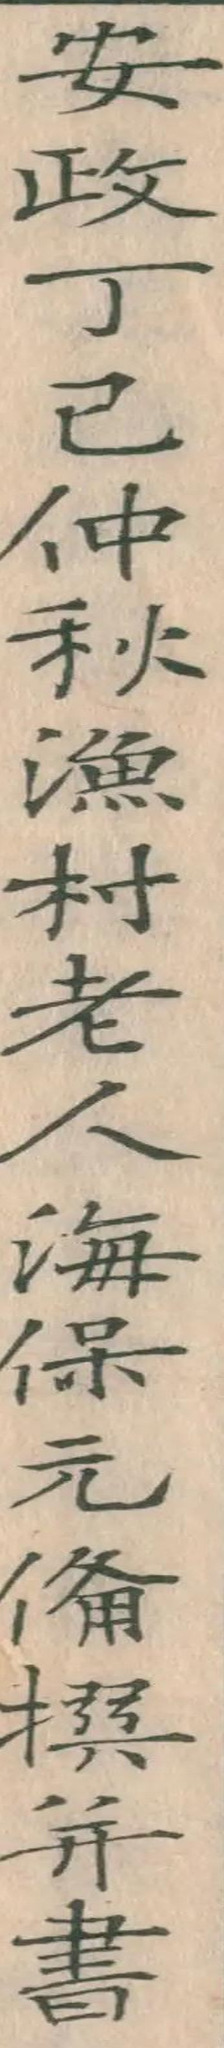安政丁巳仲秋漁村老人海保元備撰并書
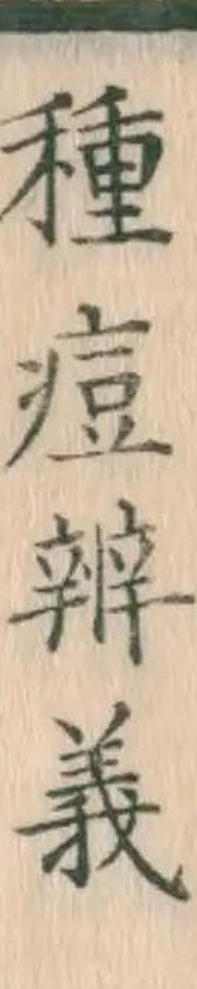種痘弁義
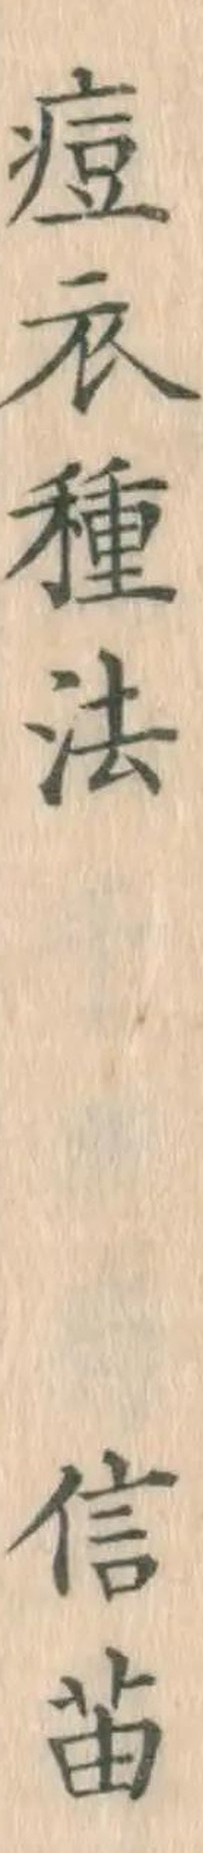痘衣種法信苗
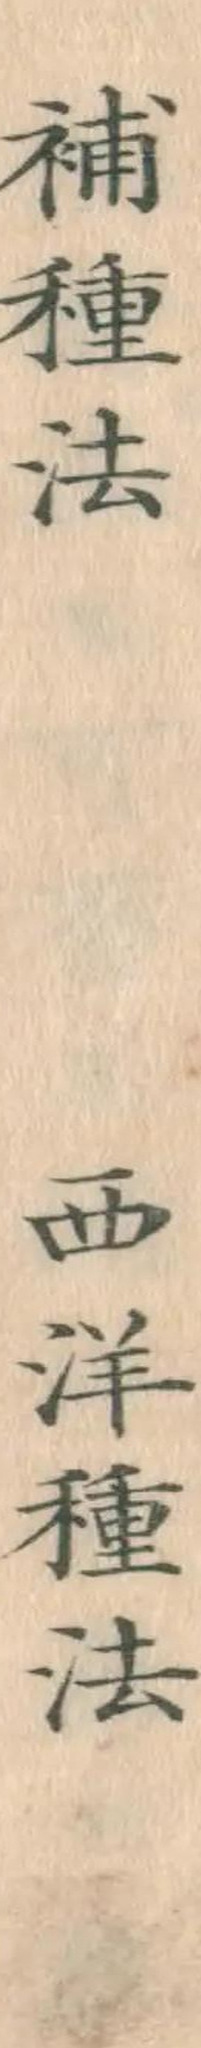補種法西洋種法

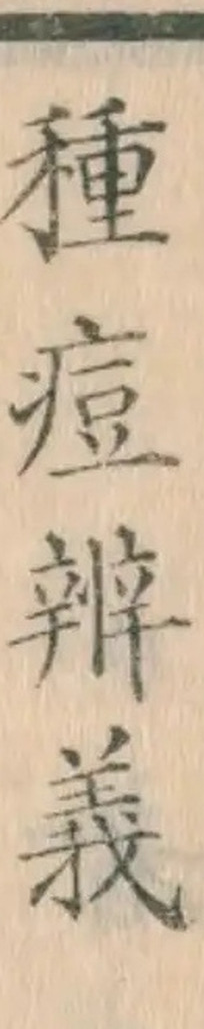種痘弁義
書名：種痘弁義
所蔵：国立国会図書館 National Diet Library, JAPAN
